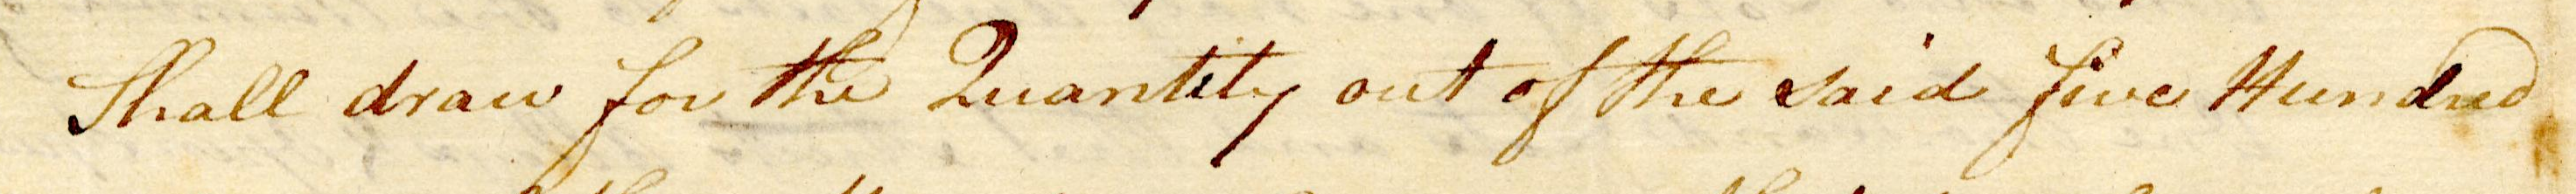shall draw for the Quantity out of the said five Hundred
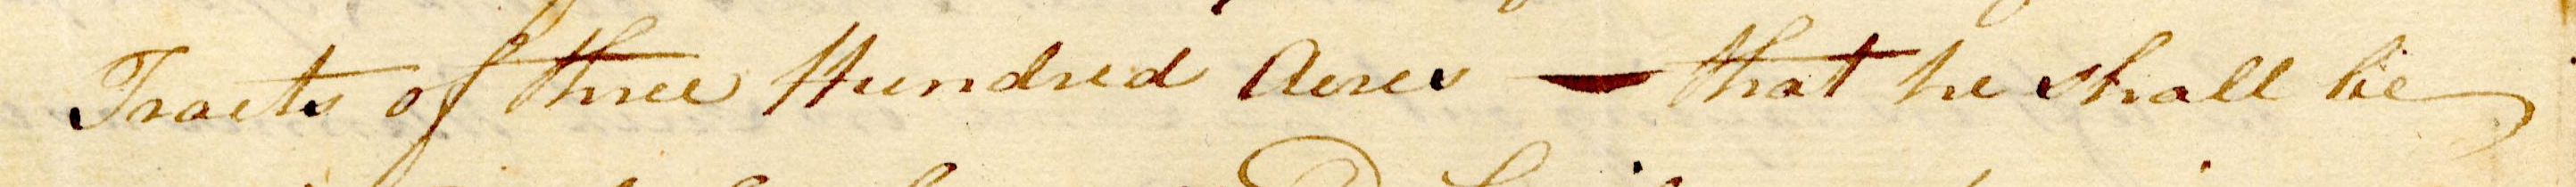Tracts of three Hundred Acres- that he shall be
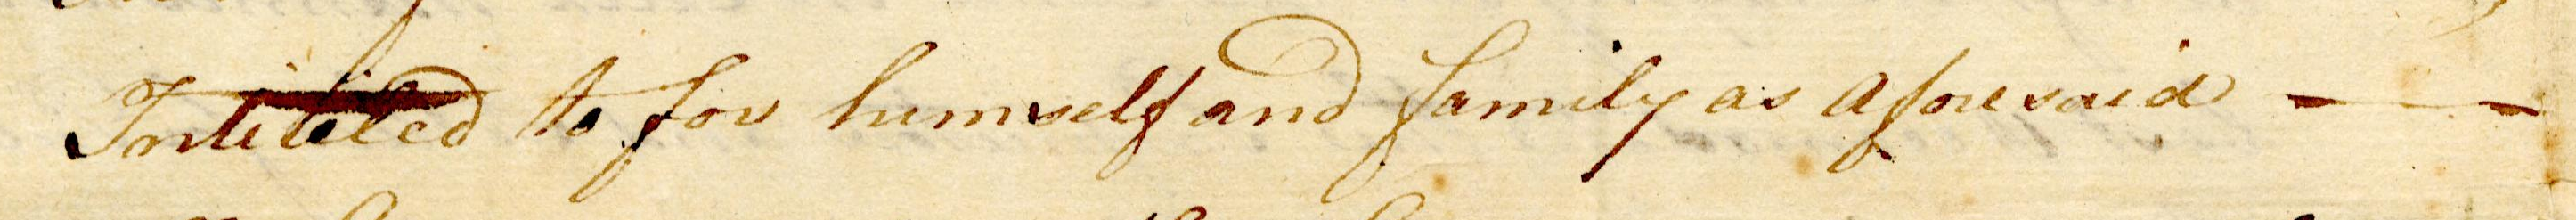Intitiled to for himself and family as aforesaid-
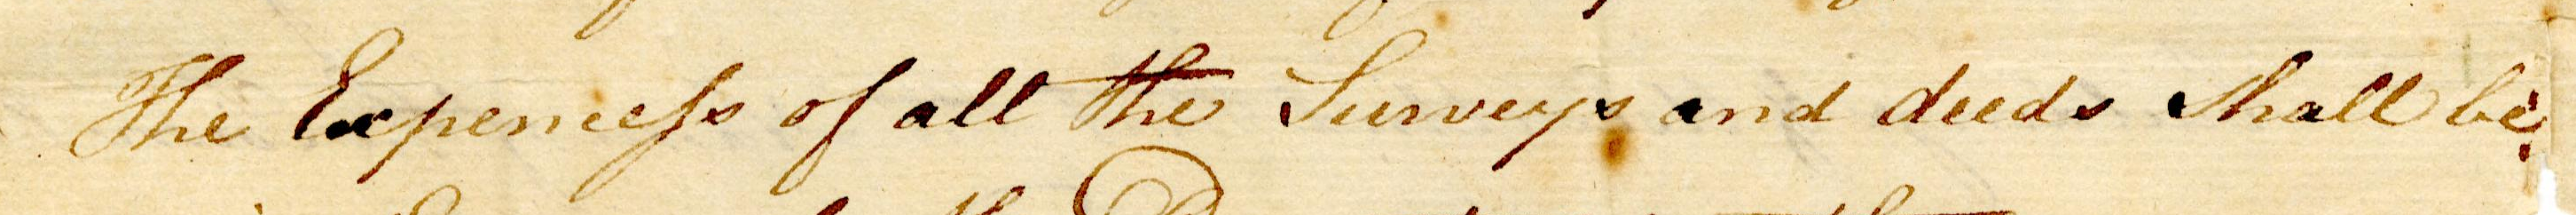The Expenses of all the Surveys and deeds shall be
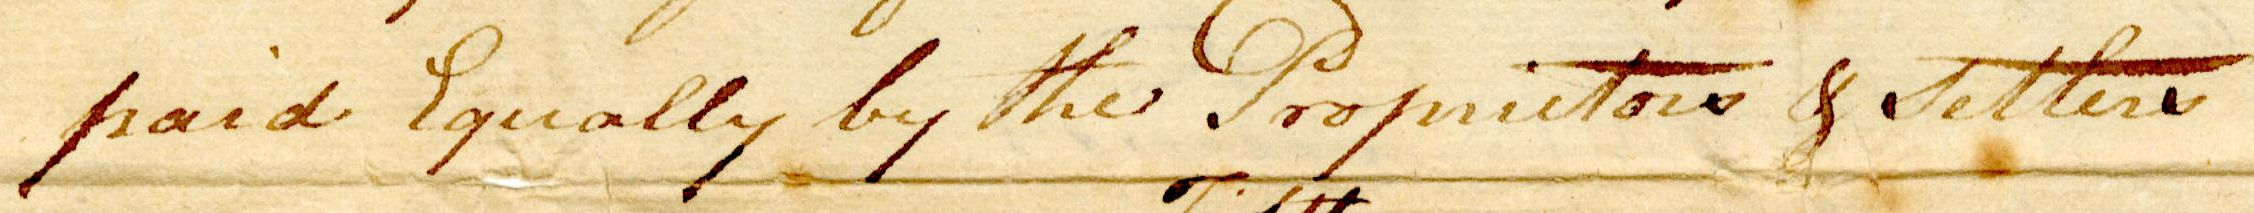paid Equally by the Proprietors & setlers
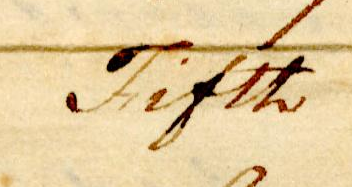Fifth
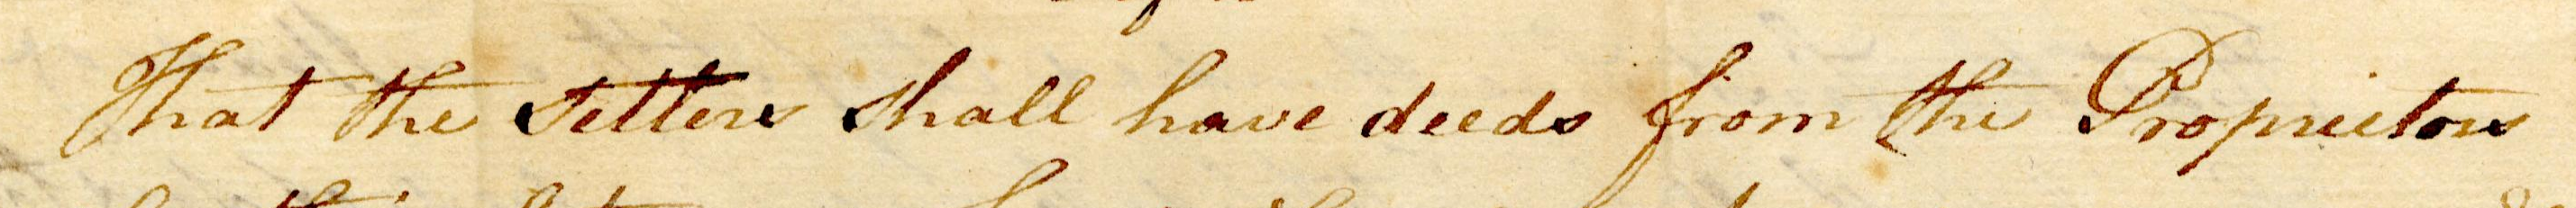That the setlers shall have deeds from the Proprietors
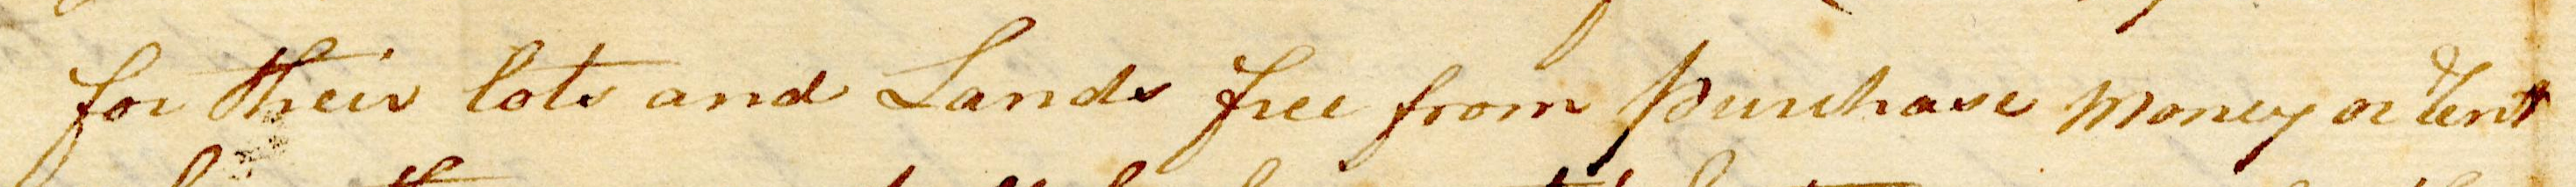for their lots and Lands free from purchase money or rent
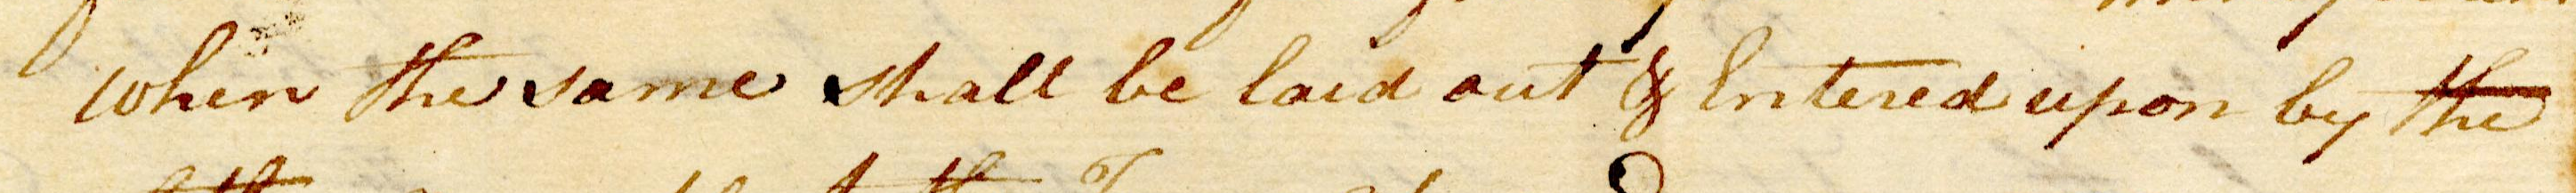when the same shall be laid out & Entered upon by the
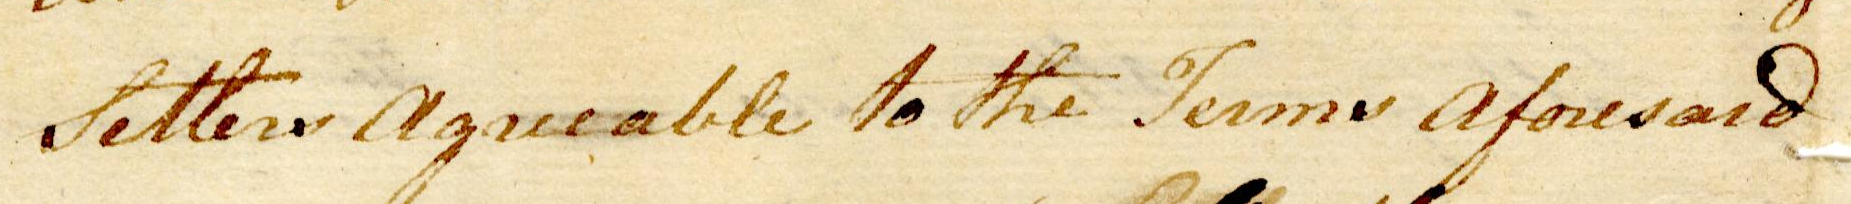Setlers agreeable to the Terms aforesaid
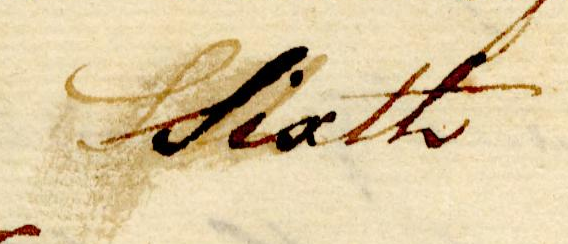Sixth
